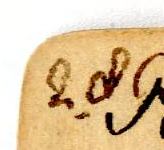28
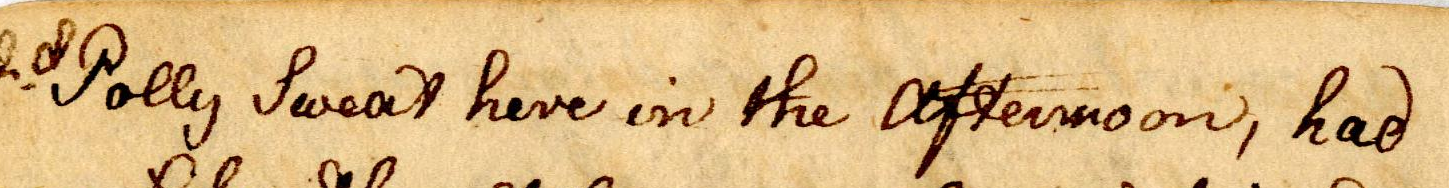Polly Sweat here in the Afternoon, has
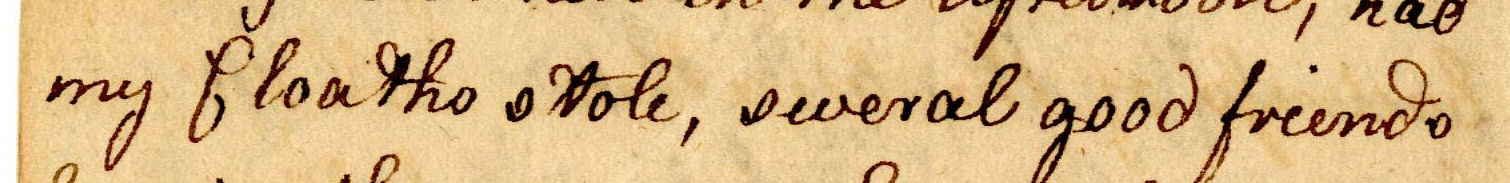my Cloaths stole, several good friends
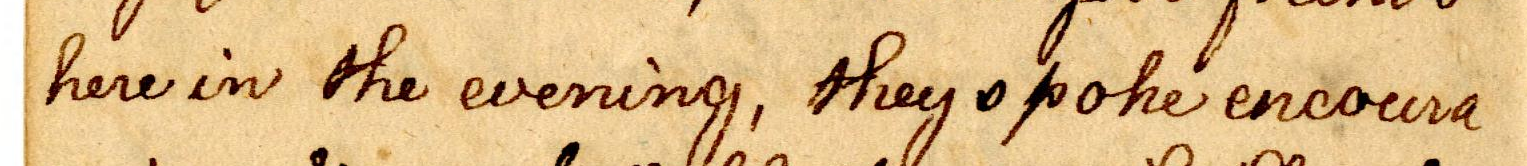here in the evening, they spoke encoura
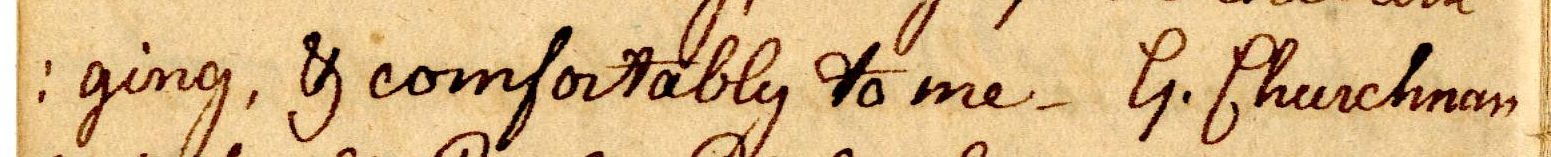-ging, & comfortably to me- G. Churchnan
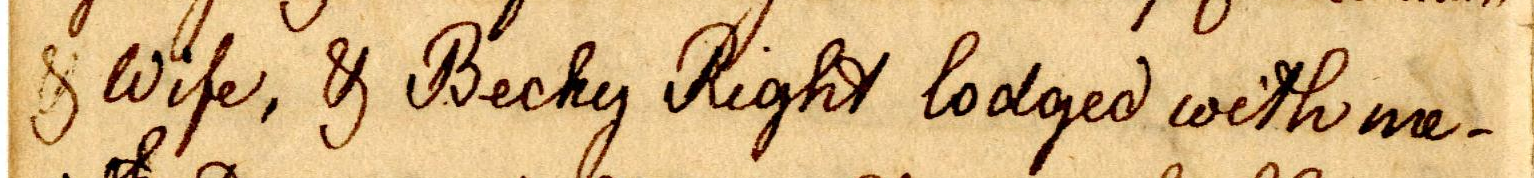& Wife, & Becky Right lodged with me-
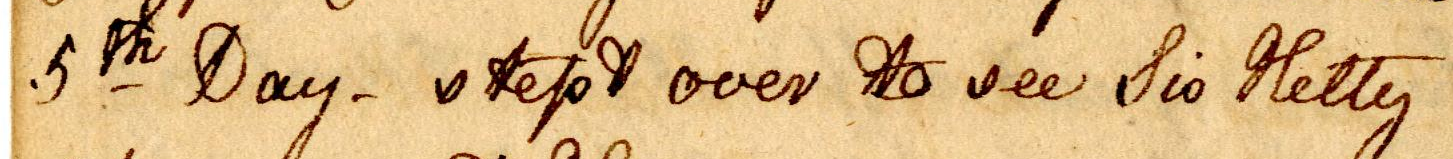5^th Day- stept over to see Sis Hetty
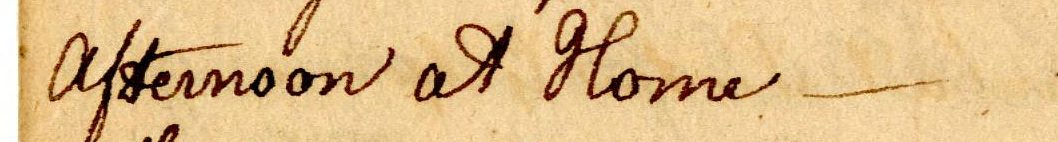Afternoon at Home-
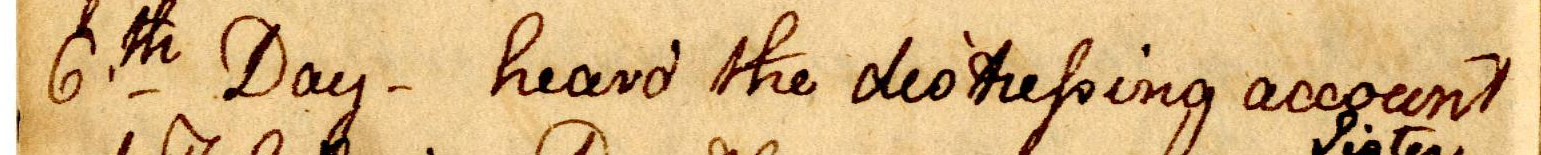6^th Day- heard the distressing account
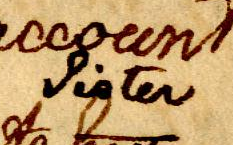Sister
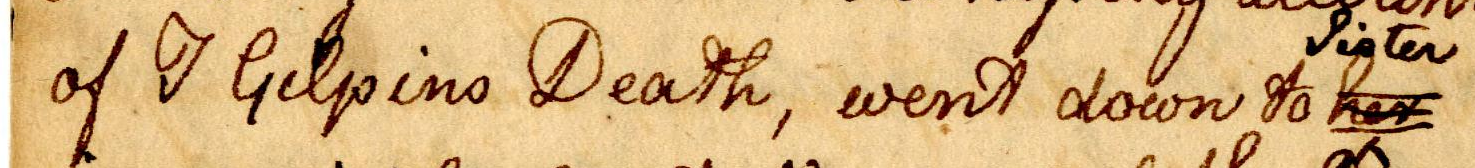of T Gilpins Death, went down to her
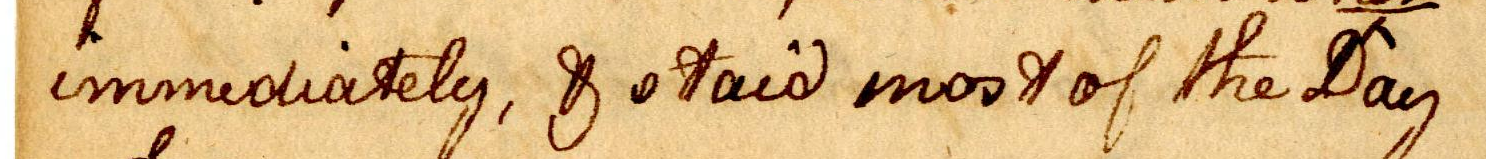immediately, & staid most of the Day
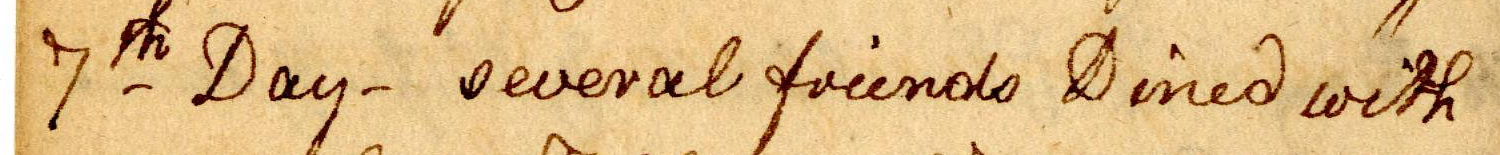7^th Day- several friends Dined with
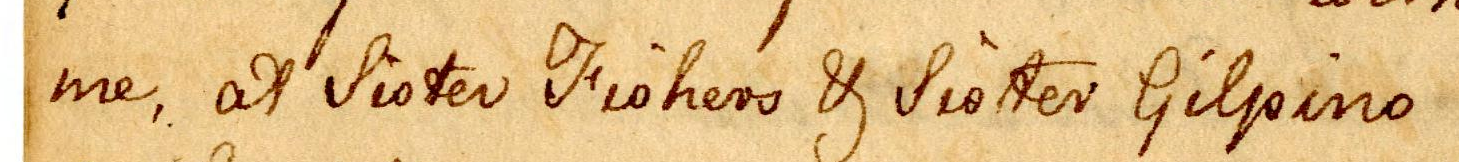me, at Sister Fishers & Sister Gilpins
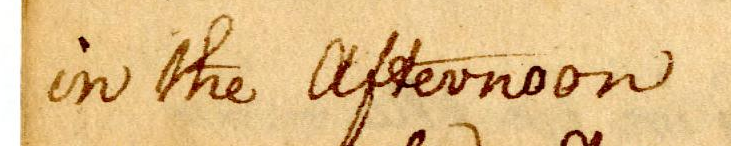in the Afternoon
